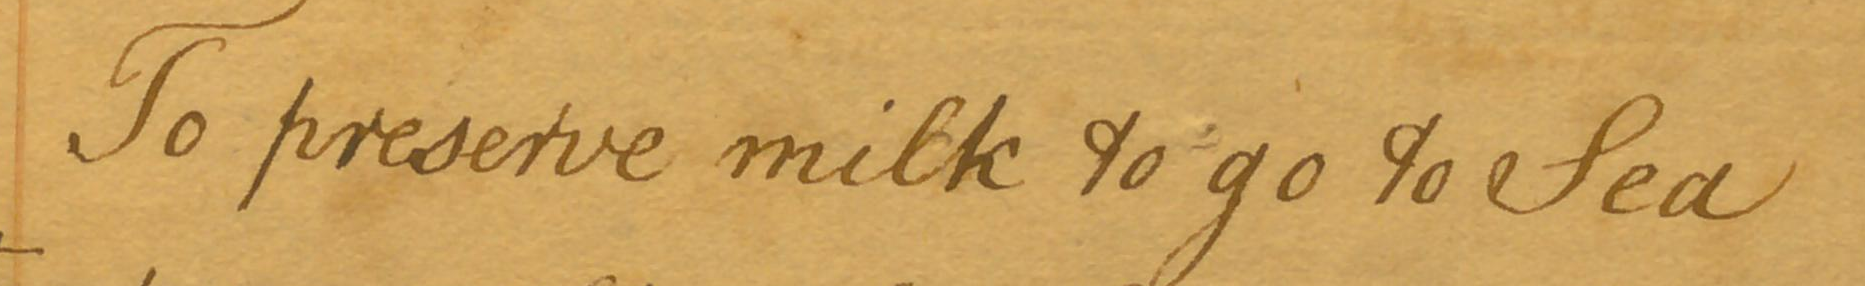To preserve milk to go to Sea
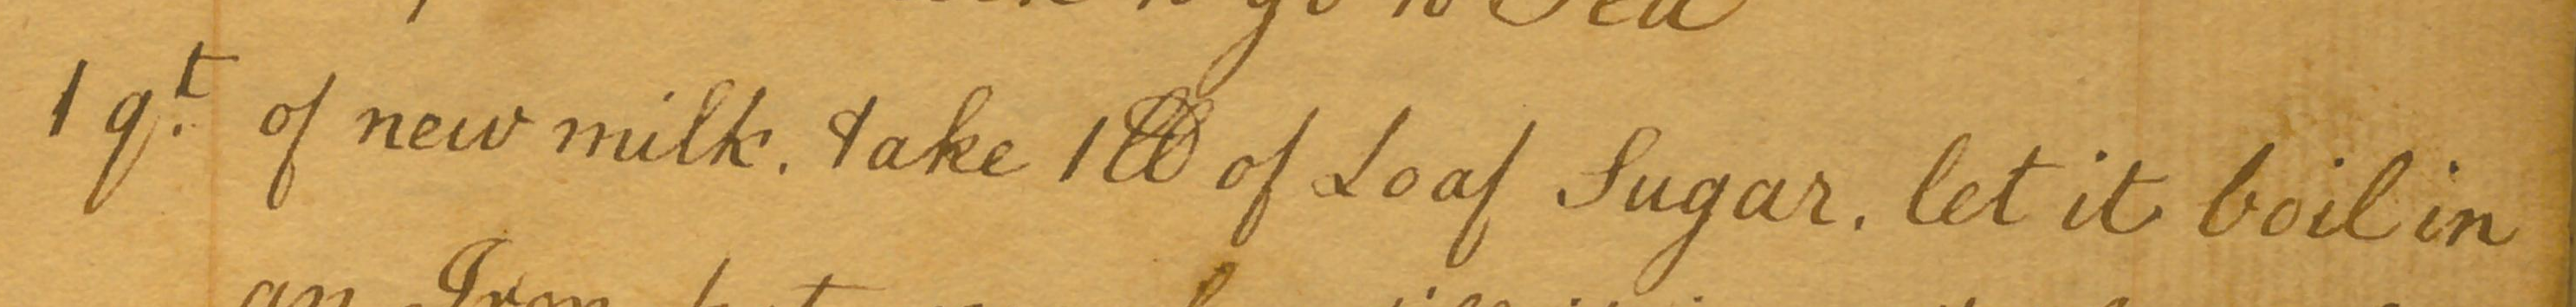1 q^t. of new milk. take 1 lb of Loaf sugar. let it boil in
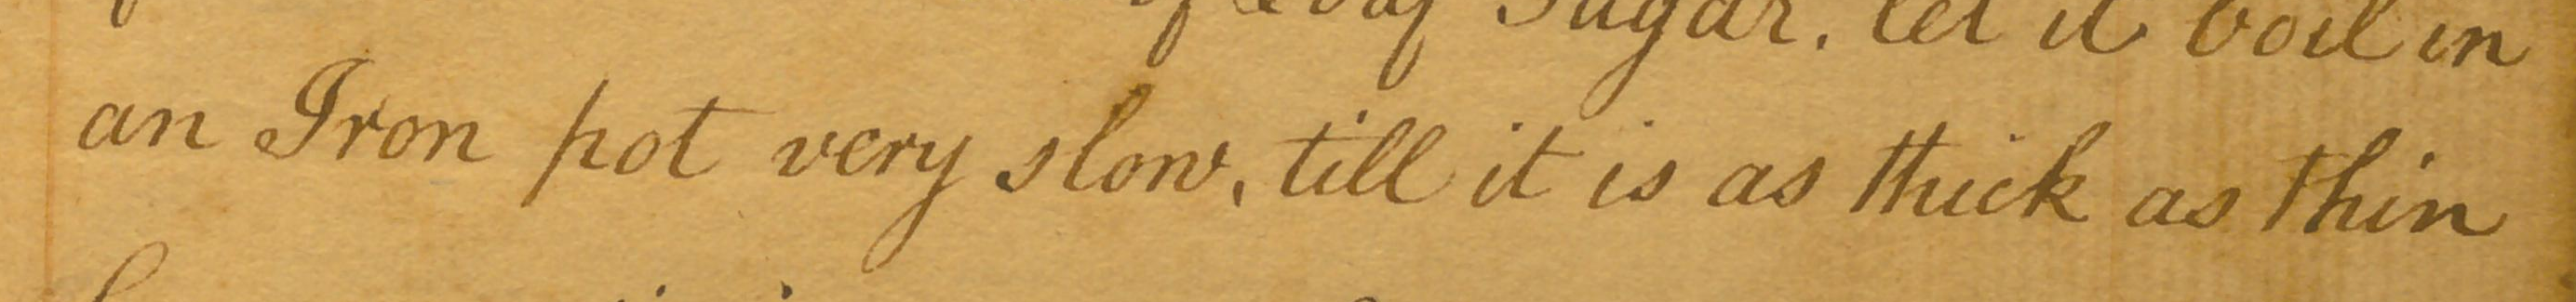an Iron pot very slow, till it is as thick as thin
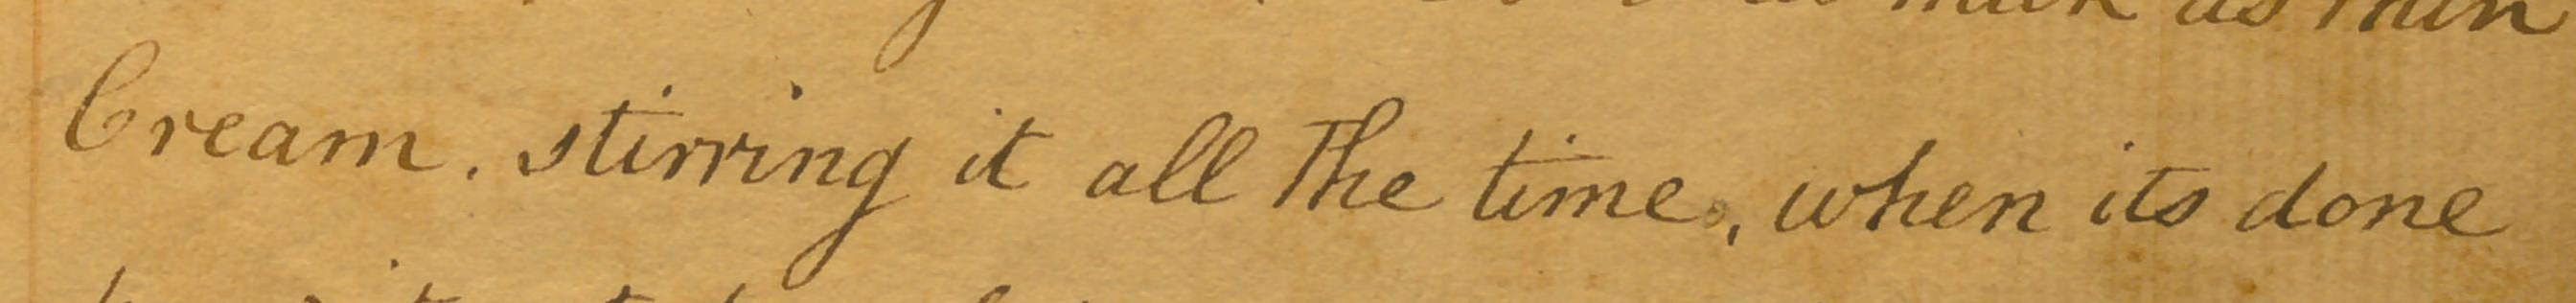Cream, stirring it all the time, when its done
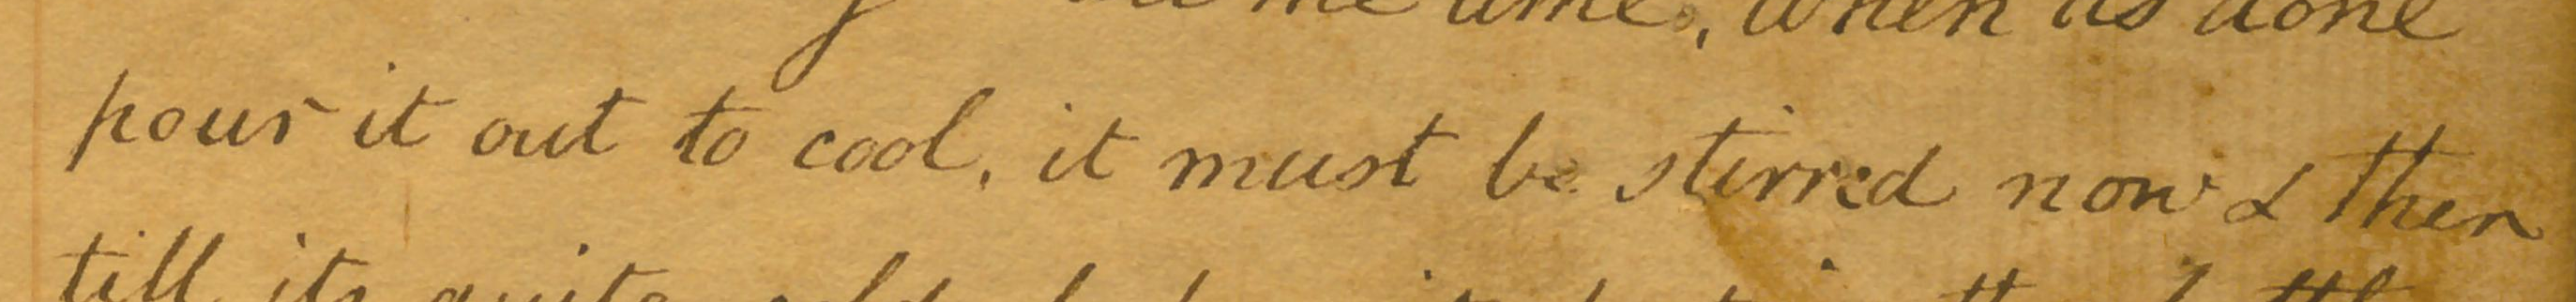pour it out to cool. it must be stirred now & then
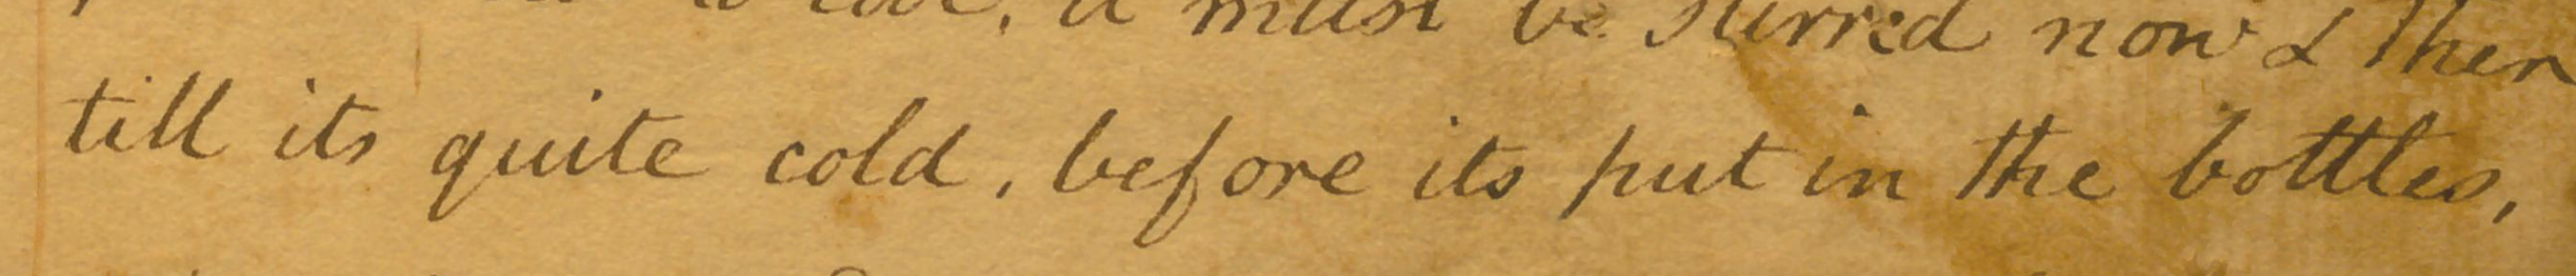till its quite cold, before its put in the bottles,
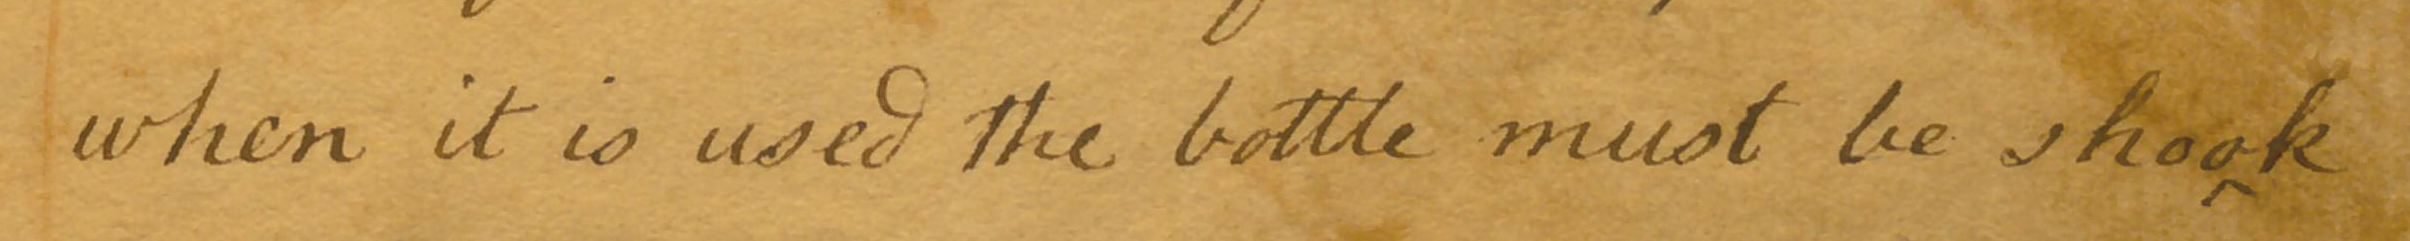when it is used the bottle must be shook
